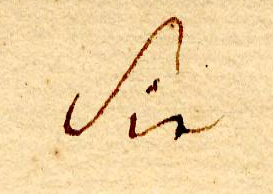Sir
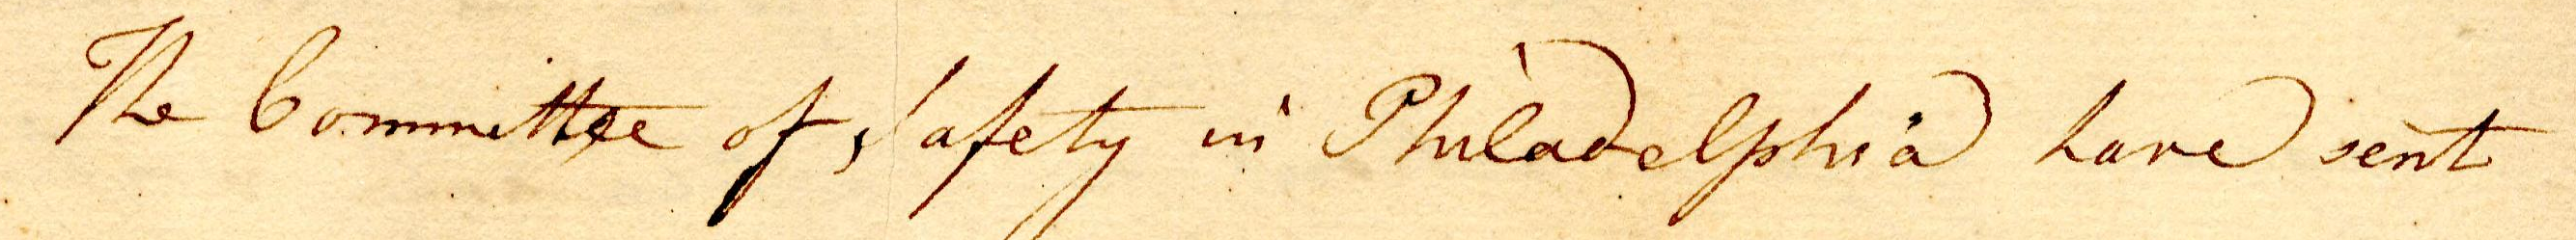The Committee of Safety in Philadelphia have sent
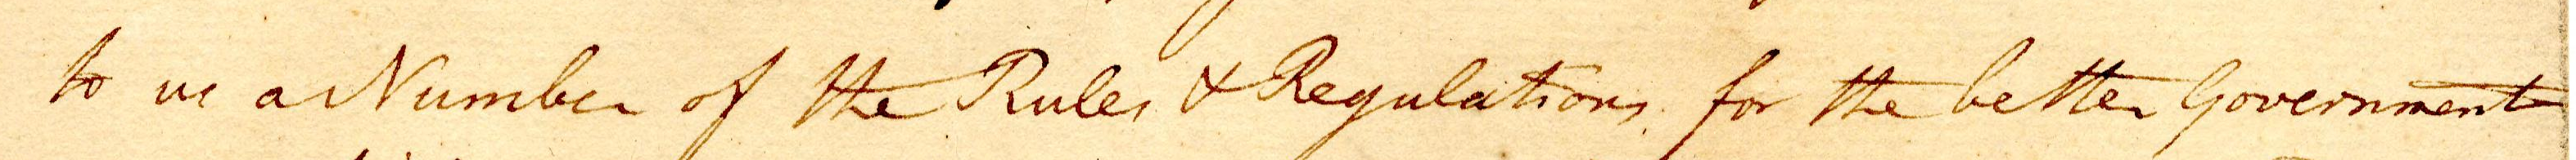to us a Number of the Rules & Regulations for the better Government
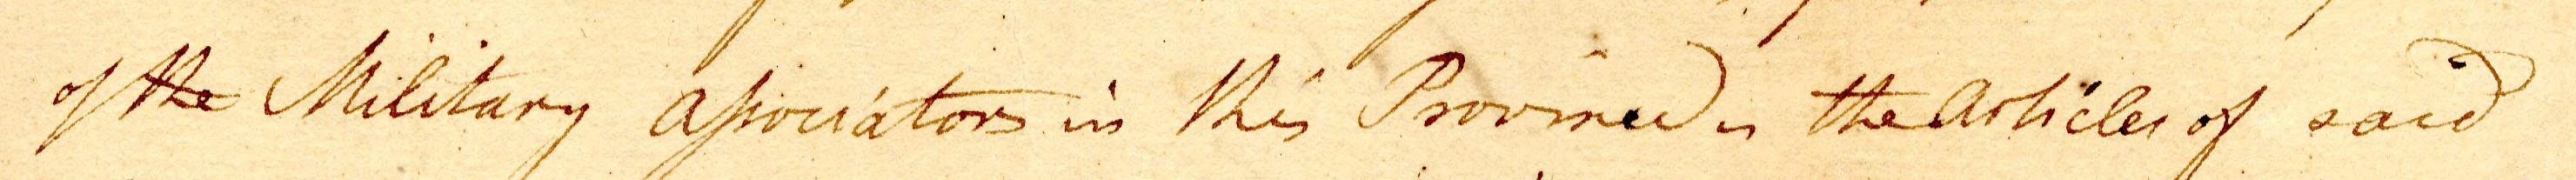of the Military associators in this Province. the Articles of said
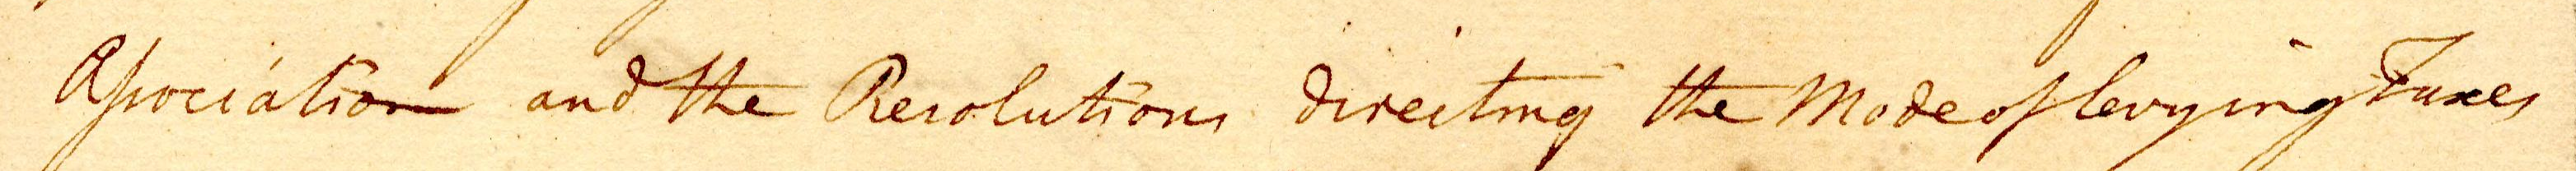Association and the Resolutions directing the Mode of levying Taxes
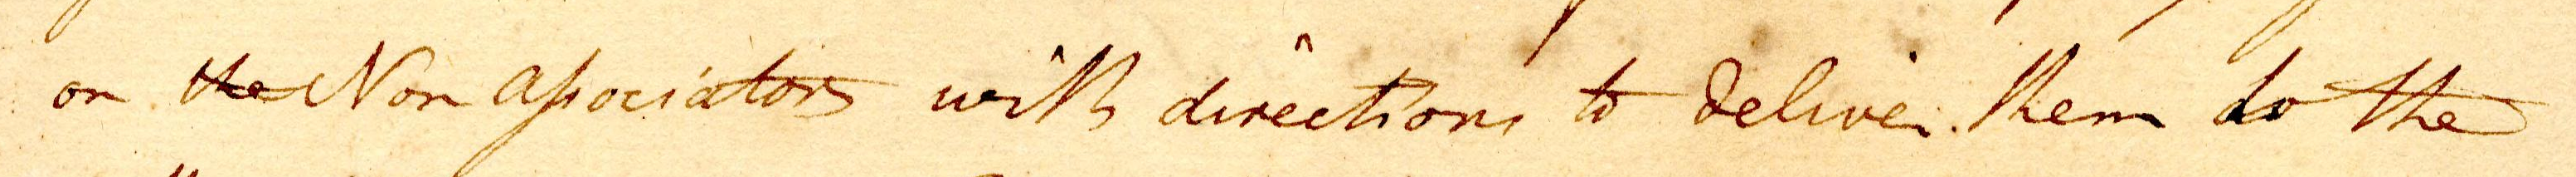on the Non associators with directions to deliver them to the
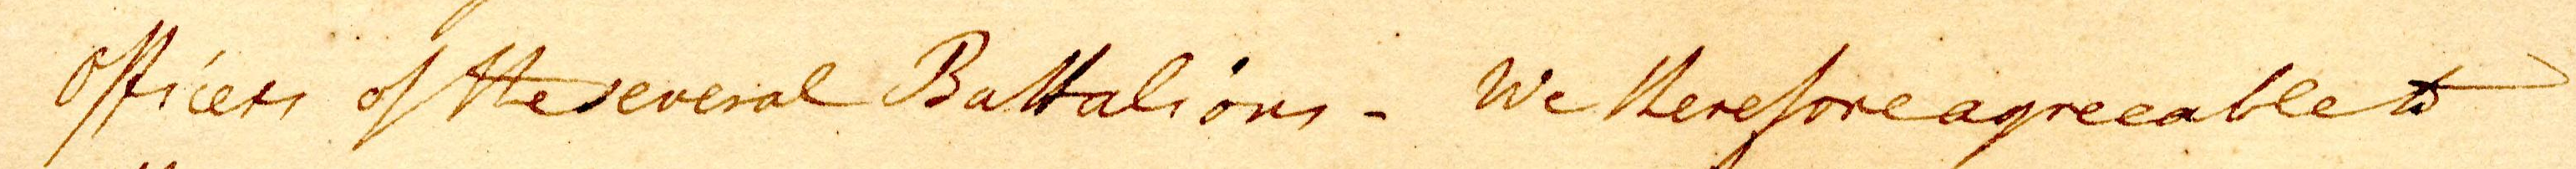Officers of the several Battalions. We therefore agreeable to
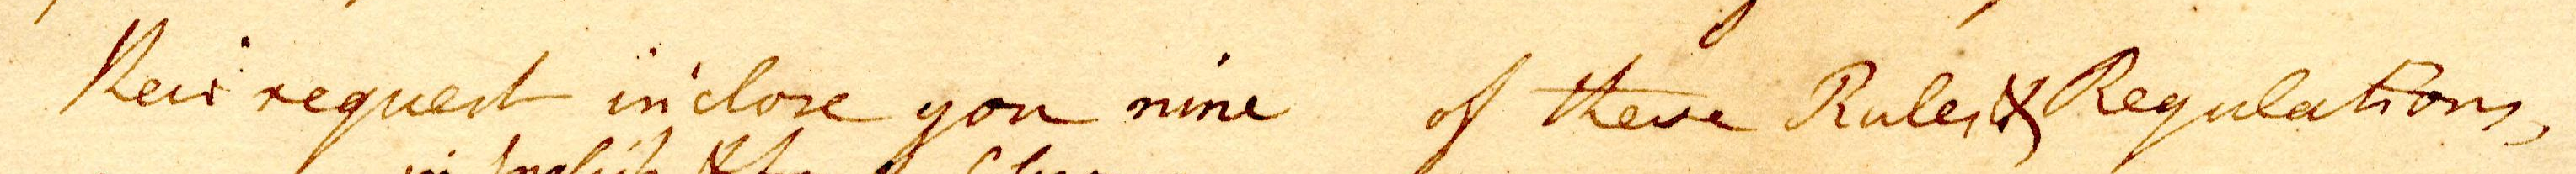their request inclose you nine of these Rules & Regulations
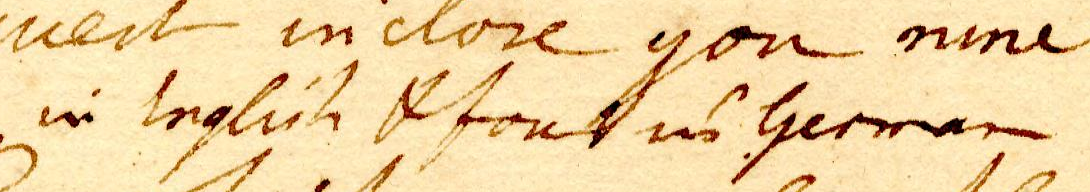in English & found German
